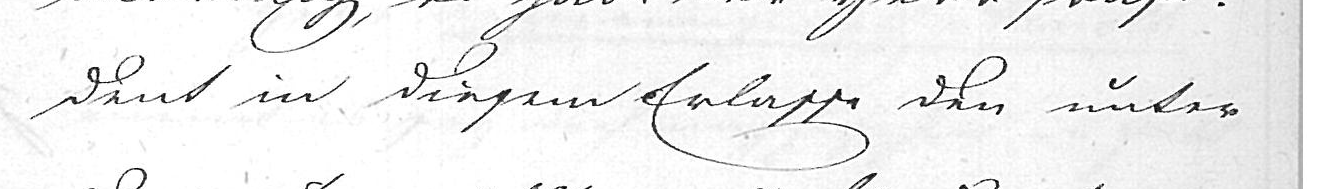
dent in diesem Erlasse den unter
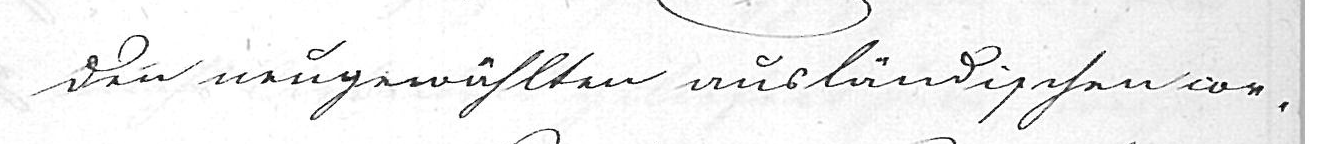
den neugewählten ausländischen cor-
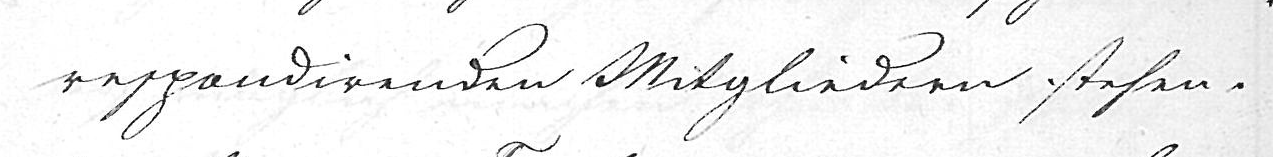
respondirenden Mitgliedern stehen,
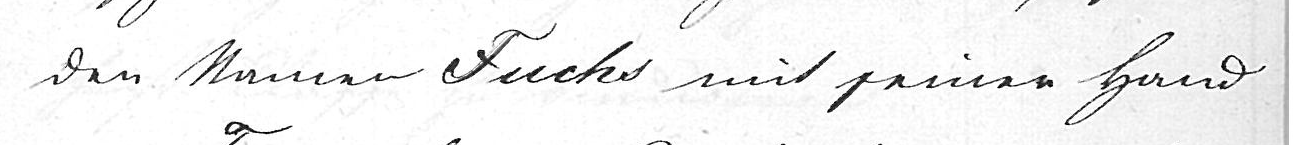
den Namen Fuchs mit seiner Hand
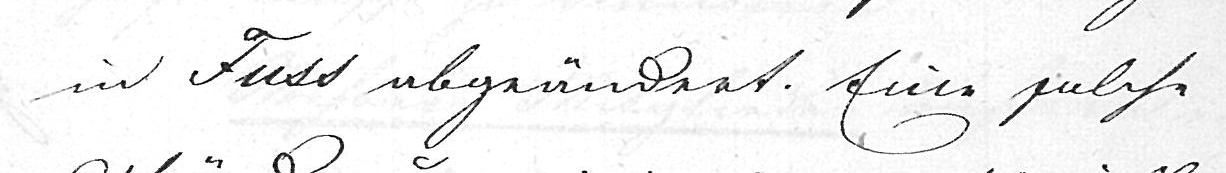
in Fuss abgeändert. Eine solche
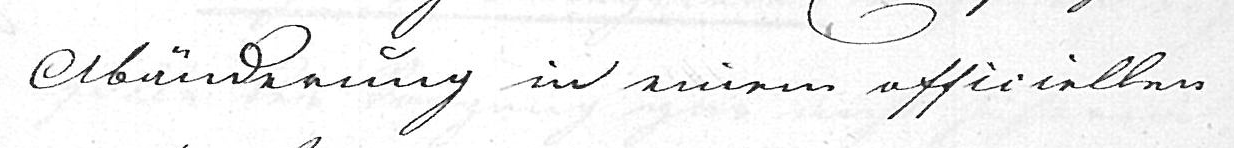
Abänderung in einem officiellen
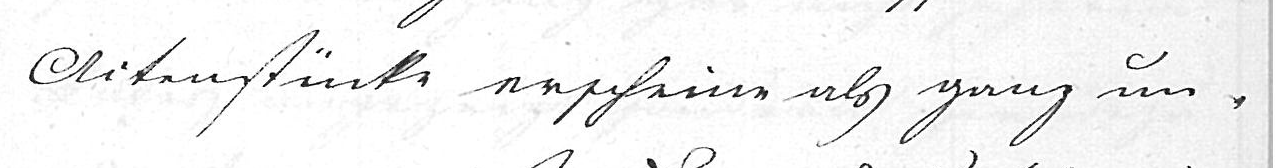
Actenstücke erscheine als ganz un-
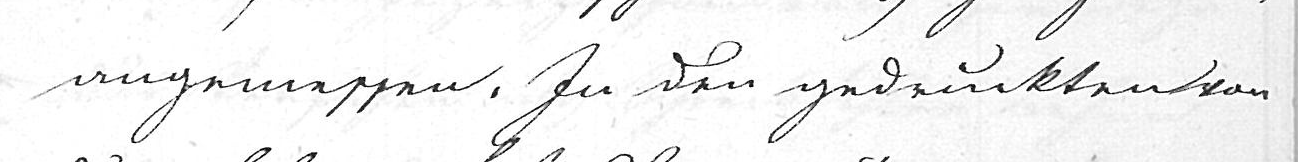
angemessen. In den gedruckten von
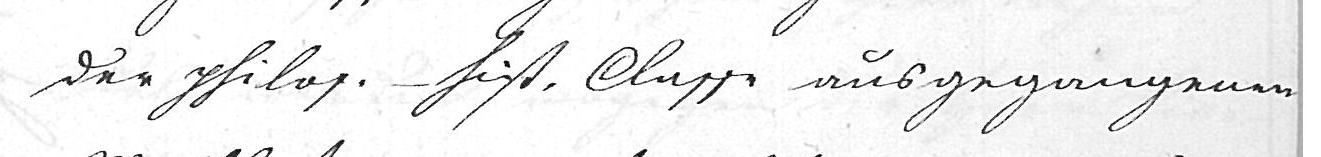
der philos.-hist. Classe ausgegangenen
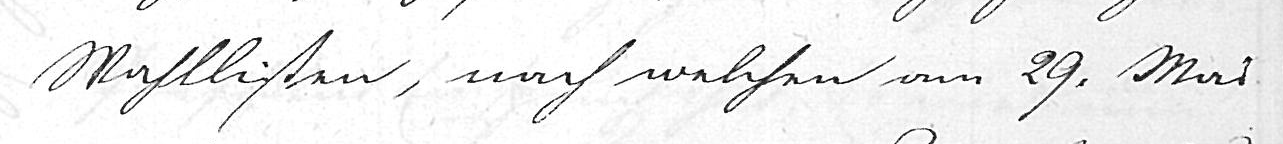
Wahllisten, nach welchen am 29. Mai
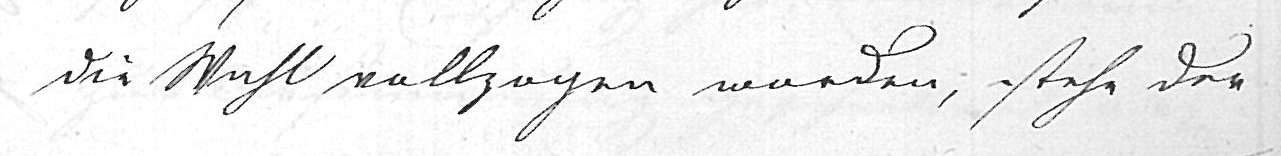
die Wahl vollzogen worden, stehe der
